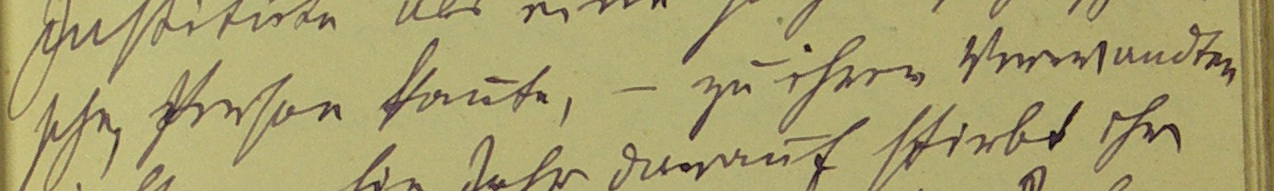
sche Person kannte,- zu ihren Verwandten
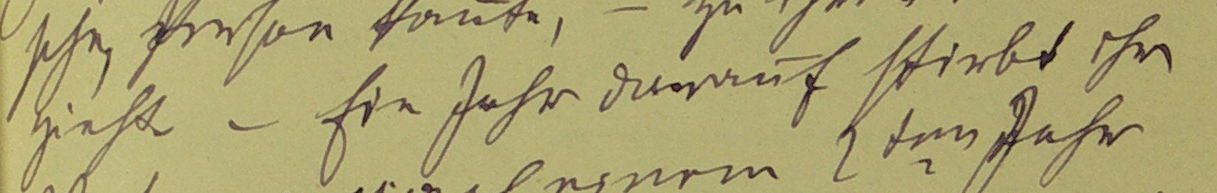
zieht,- Ein Jahr danach stirbt ihr
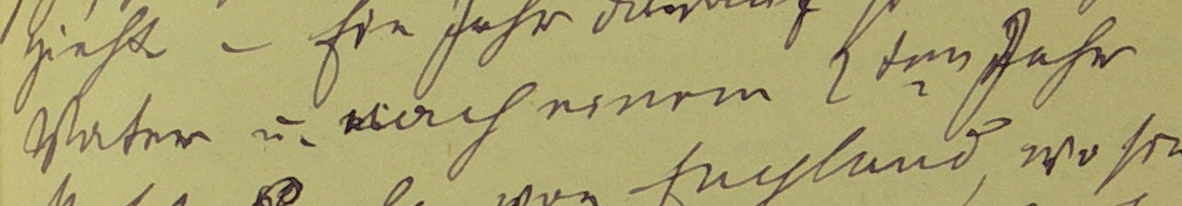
Vater und nach einem 2- ten Jahr kehrt
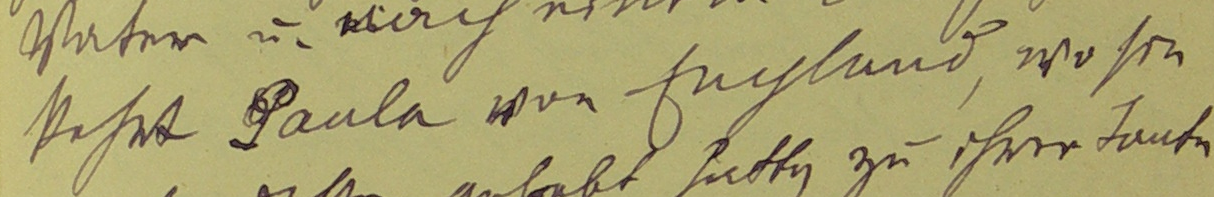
Paula von England , wo sie
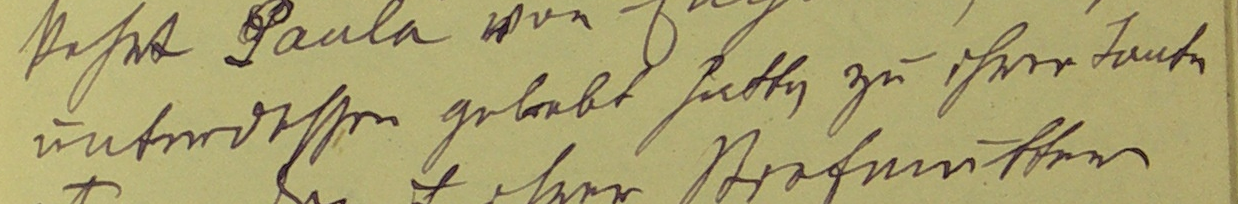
unterdeßen gelebt hatte zu ihrer Tante
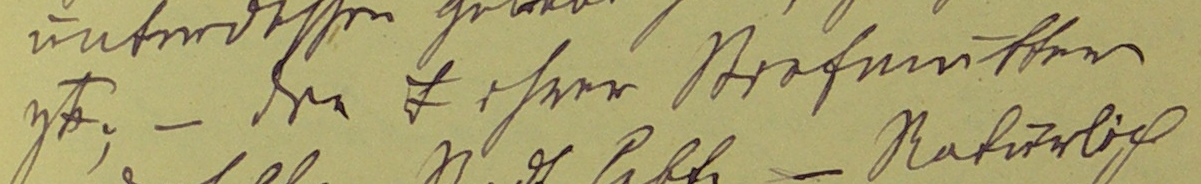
zurück.- Die mit ihrer Stiefmutter
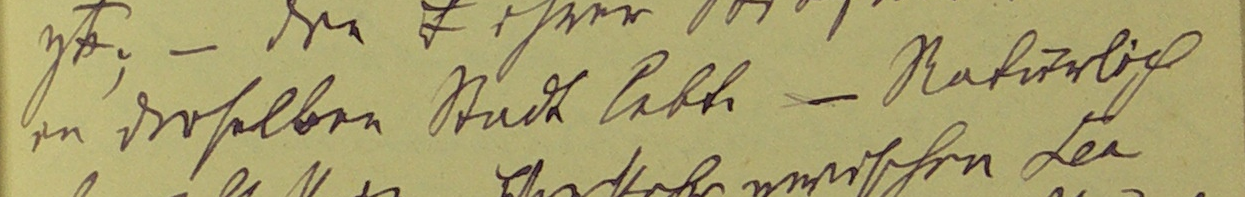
in derselben Stadt lebte,-Natürlich
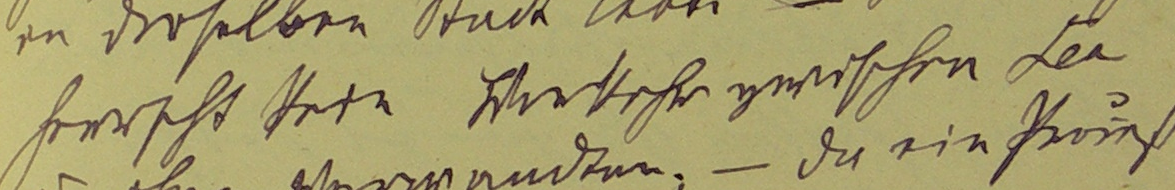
herrscht kein Verkehr zwischen Lea
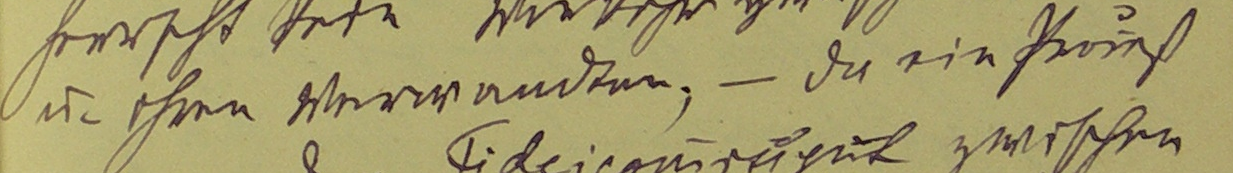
und ihren Verwandten;- Da ein Pprozess
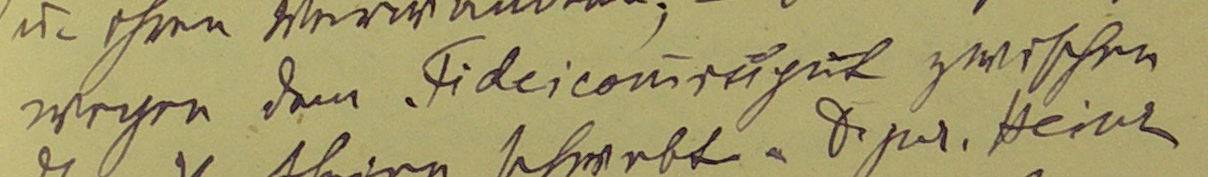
wegen dem Fideicommeisgut zwischen
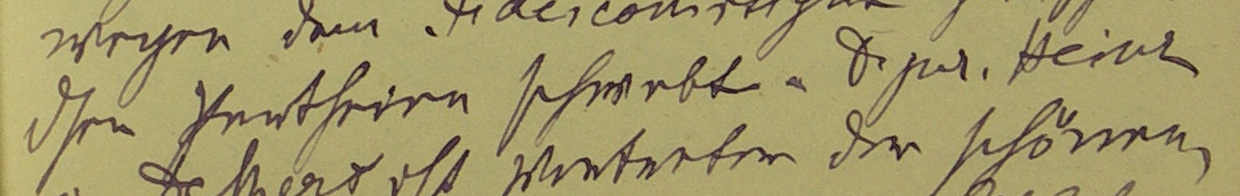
den Partheien schwebt.. Dr. jur. Hein.
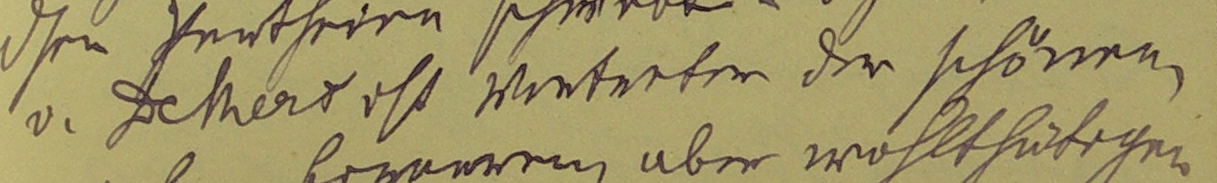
von Dekero ist Vertreter der schönen,
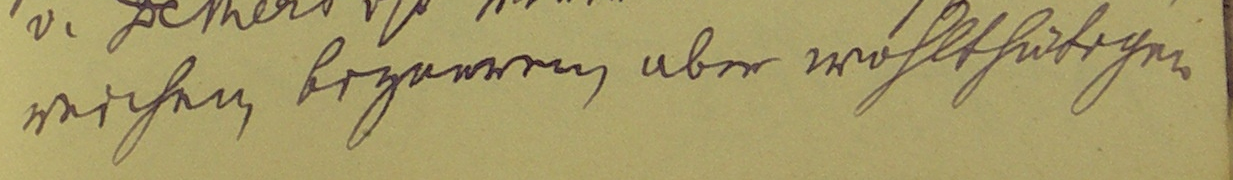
reichen, bizarren aber wohltätigen
